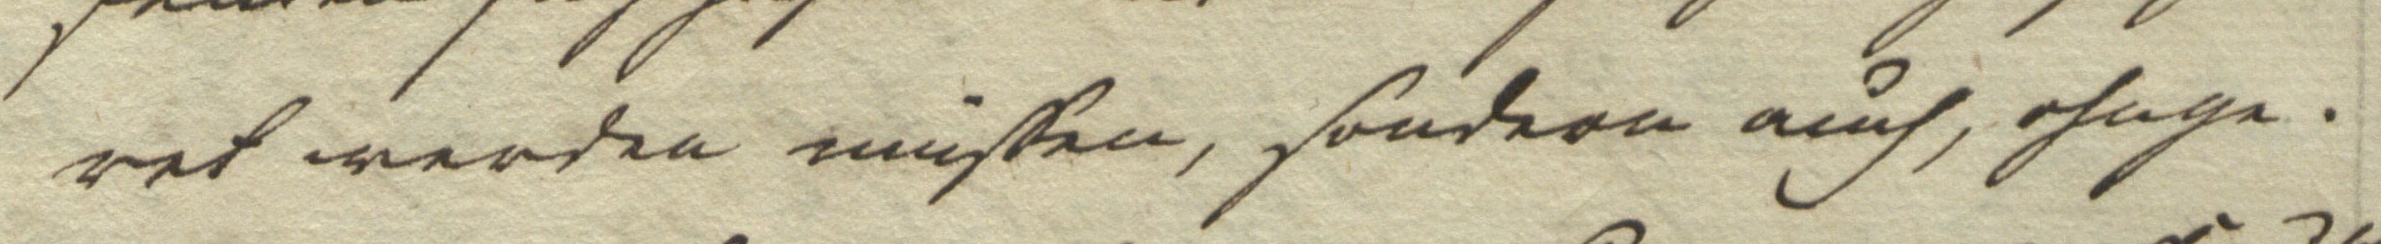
ret werden müssen, sondern auch , ohnge¬
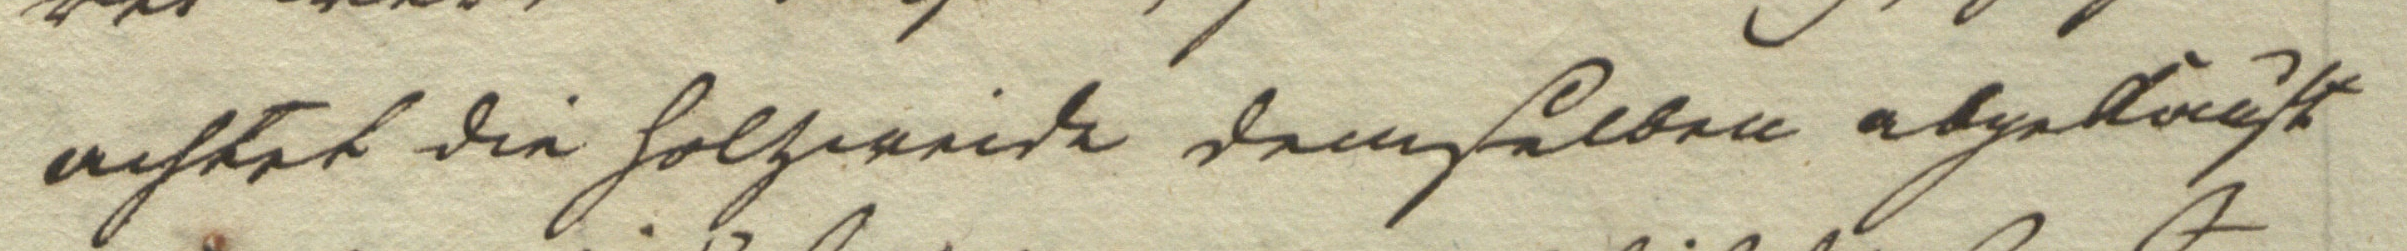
achtet die Holzweide demselben abgekauft
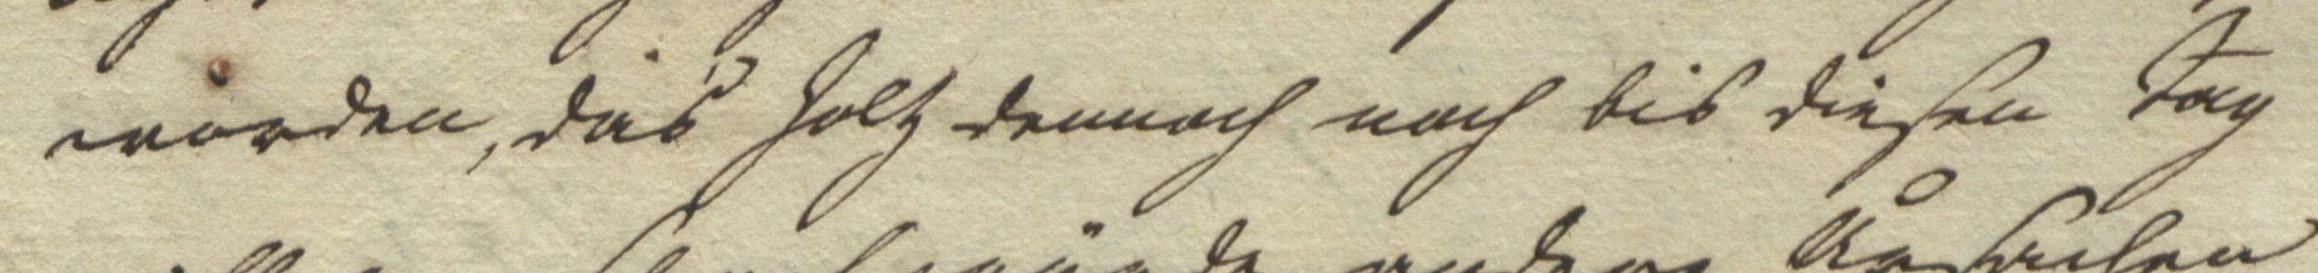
worden, das Holz dennoch noch bis diesen Tag
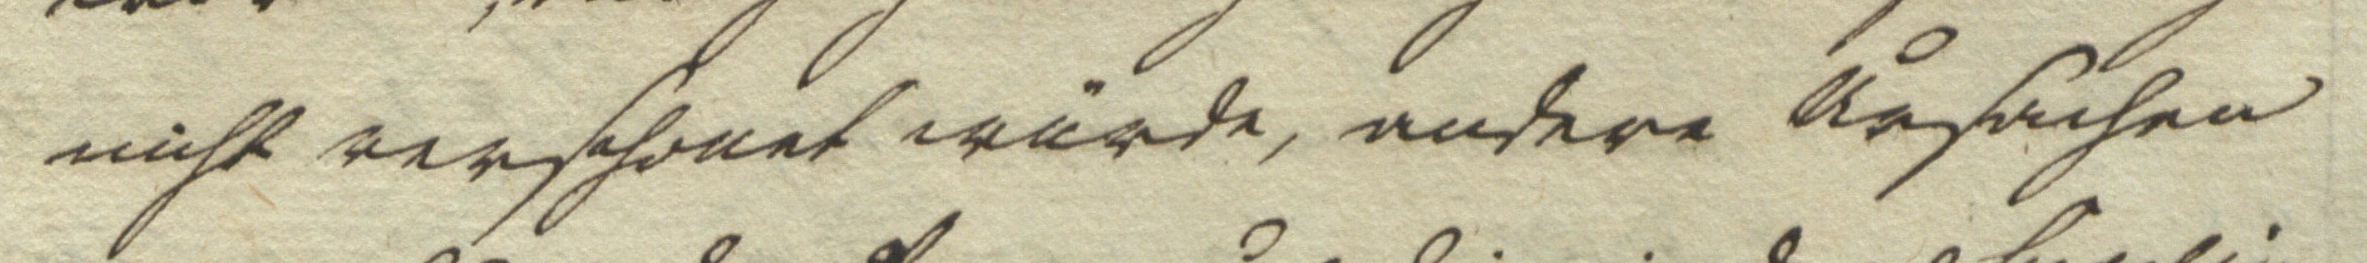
nicht verschont würde, andere Ursachen
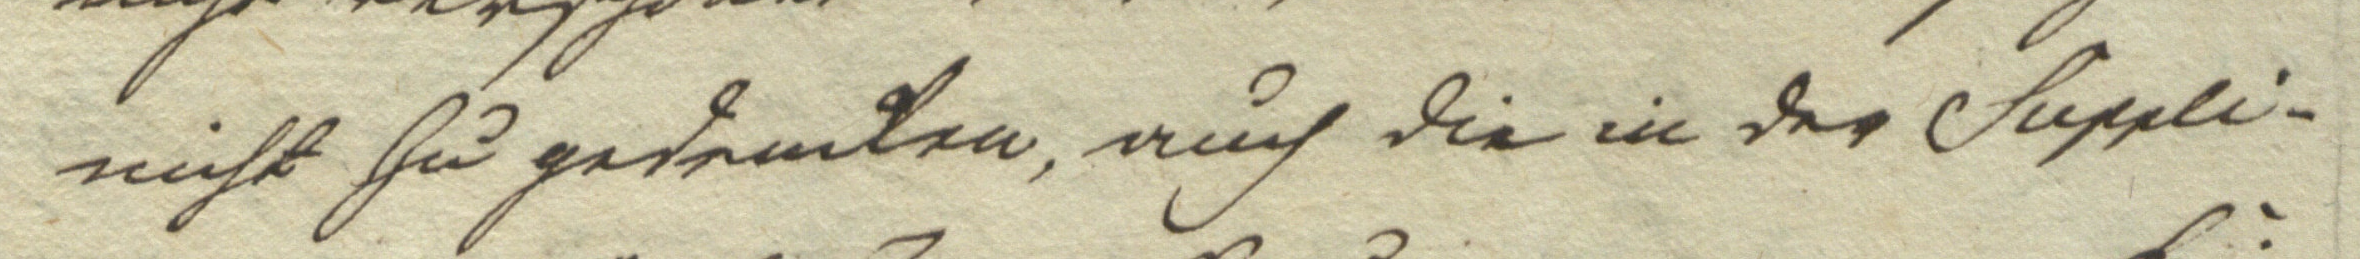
nicht zu gedenken, auch die in der Suppli¬
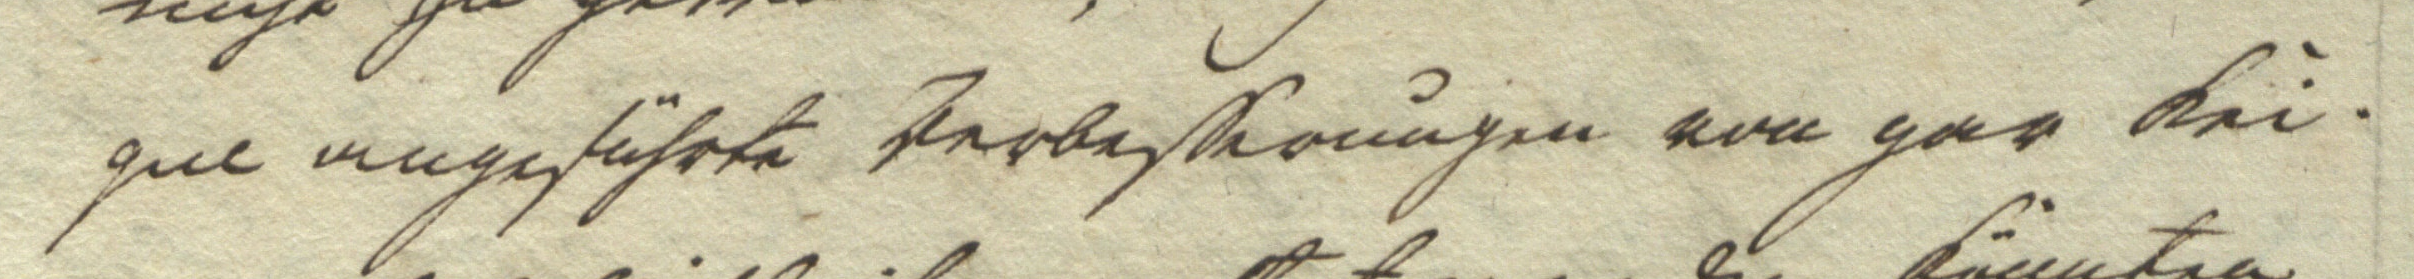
que angeführte Verbesserungen von gar kei¬
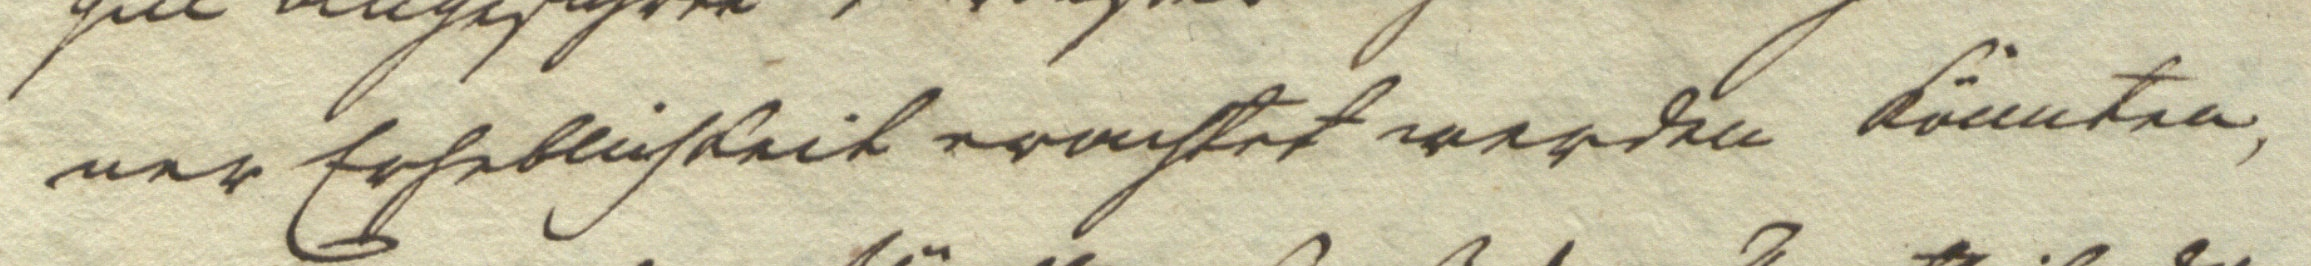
ner Erheblichkeit erachtet werden könnten,
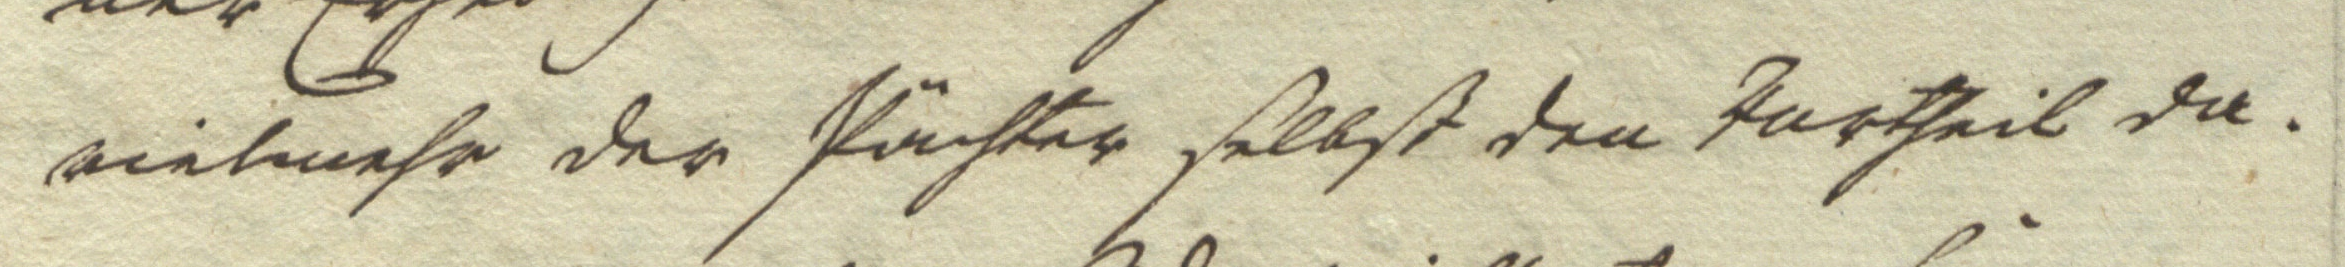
vielmehr der Pächter selbst den Vortheil da
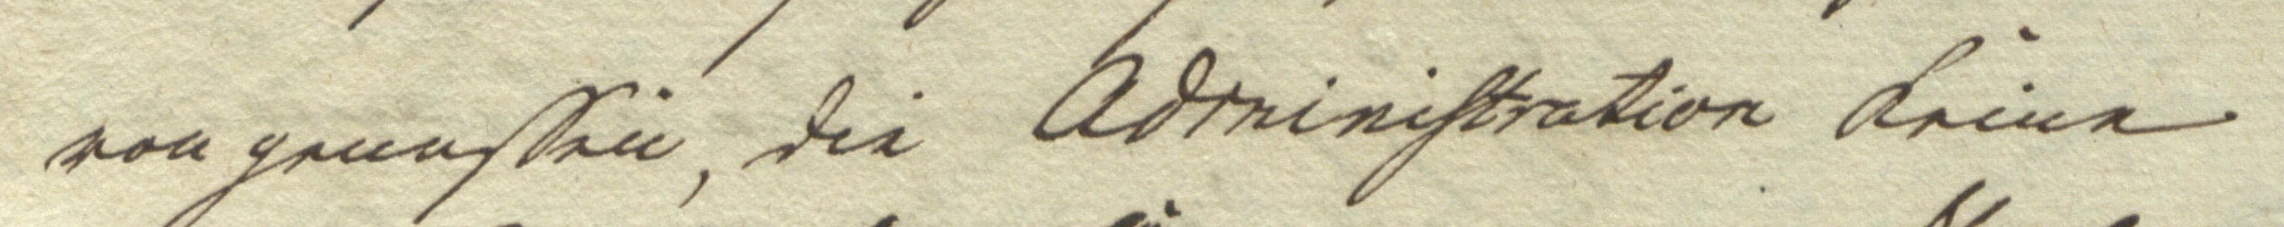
von genossen, die Administration keine
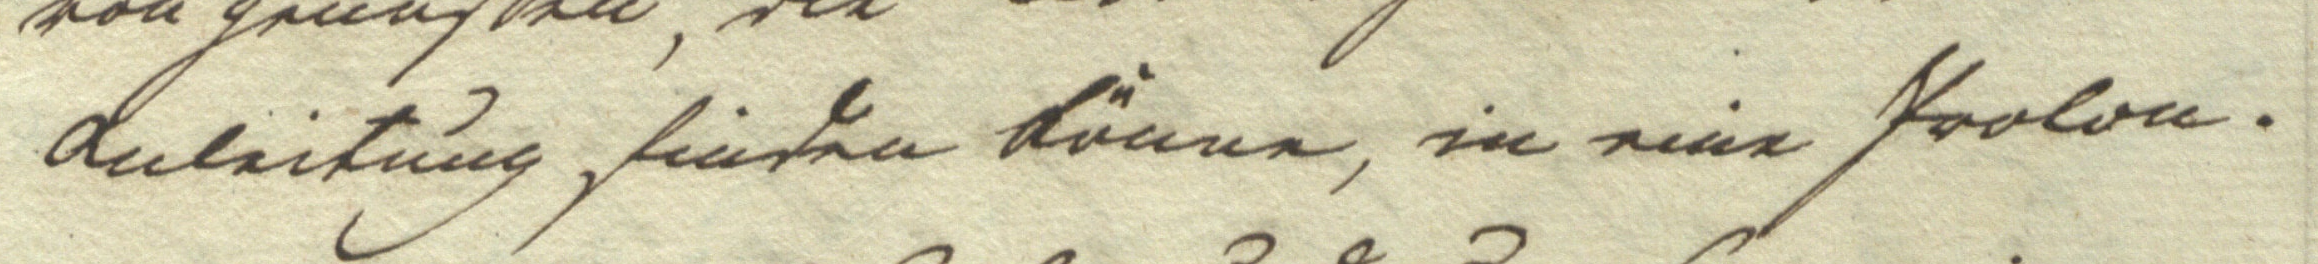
Anleitung finden könne, in eine Prolon¬
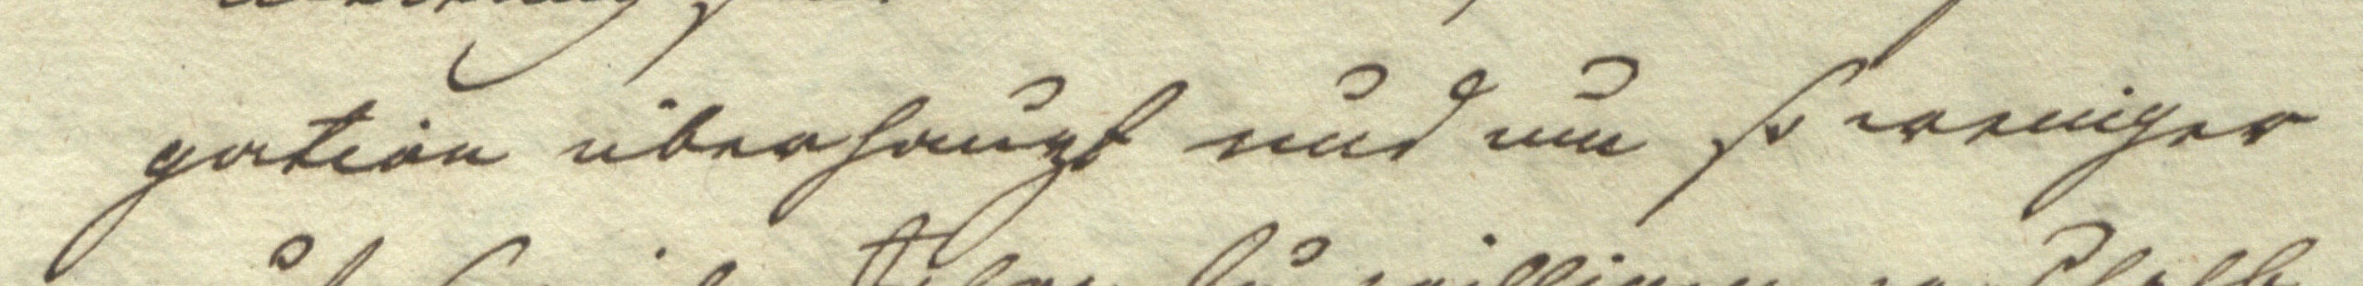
gation überhaupt und um so weniger
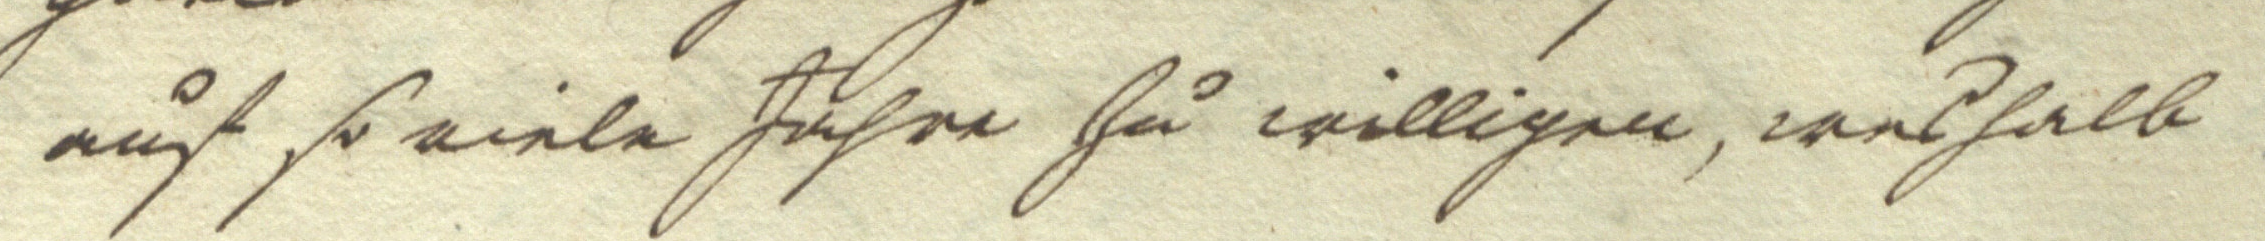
auf so viele jahre zu willigen, weshalb
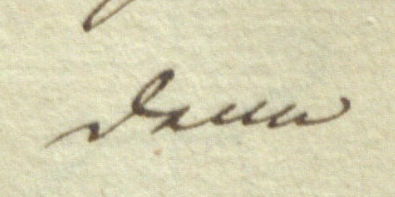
denn
